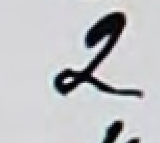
2
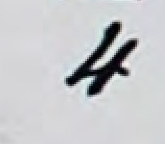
4
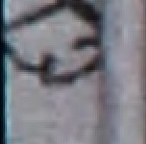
??
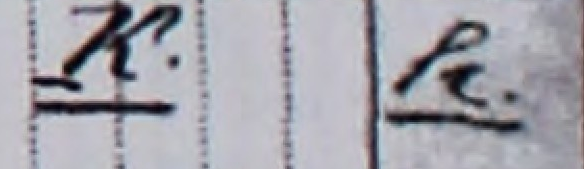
K. Pr.
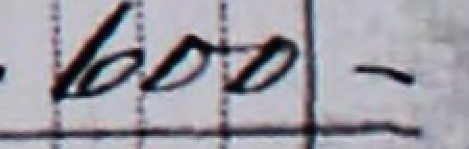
600 -
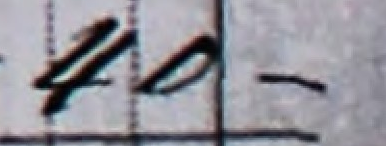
40 -
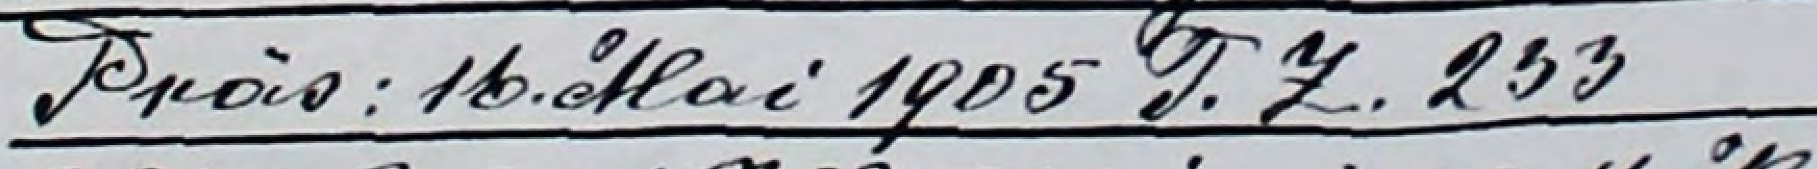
Präs: 16. Mai 1905 T.Z. 233
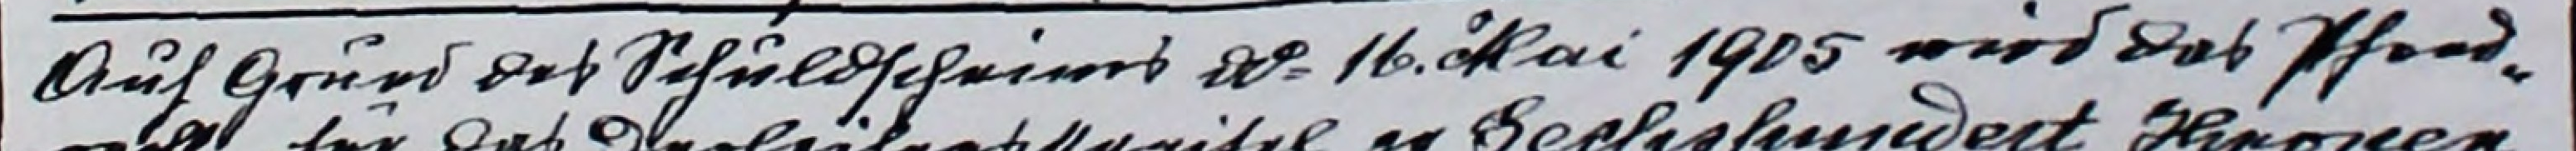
Auf Grund des Schuldscheines ddo 16. Mai 1905 wird das Pfan„
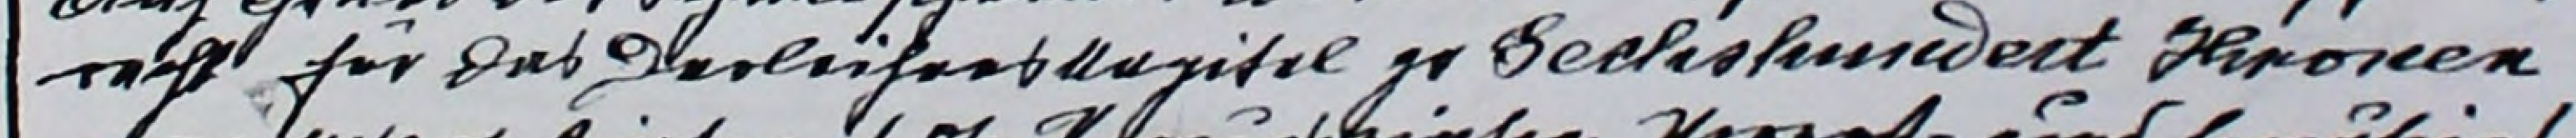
drecht für das Darleihenskapitel pr Sechshundert Kronen
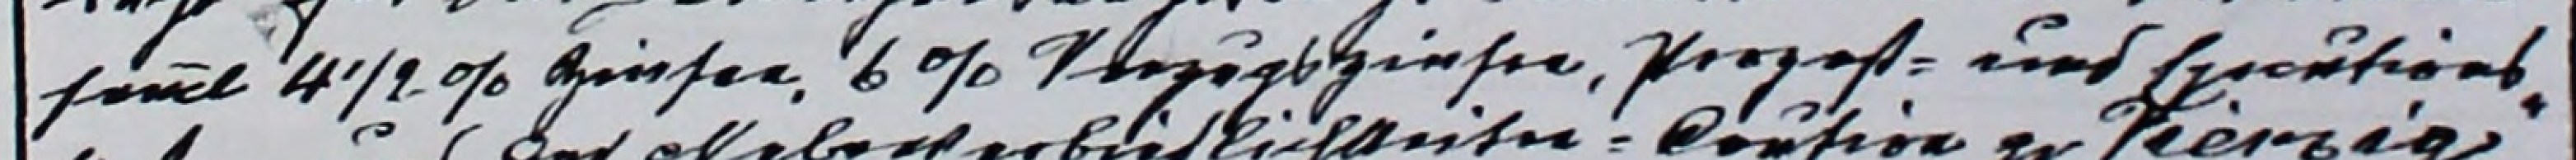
sammt 4 1/2 % Zinsen, 6 % Verzugszinsen, Perzast= und Excutions„
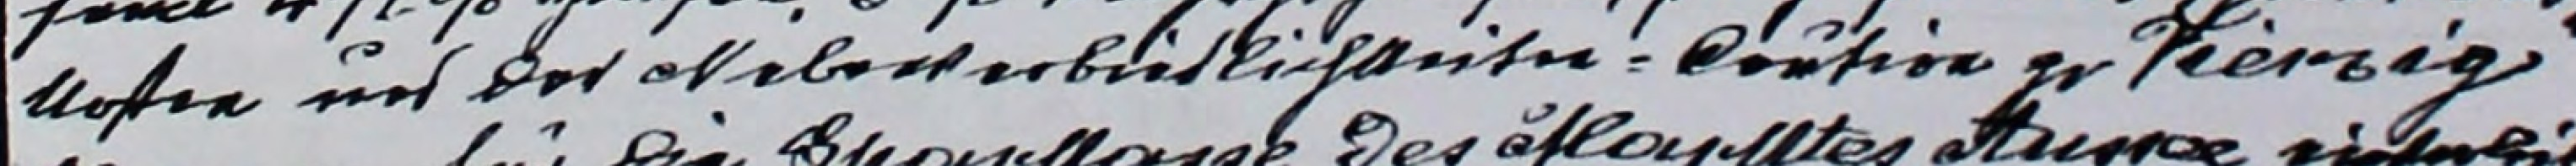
kosten und der Nebenverbindlichkeiten = Caution pr Vierzig
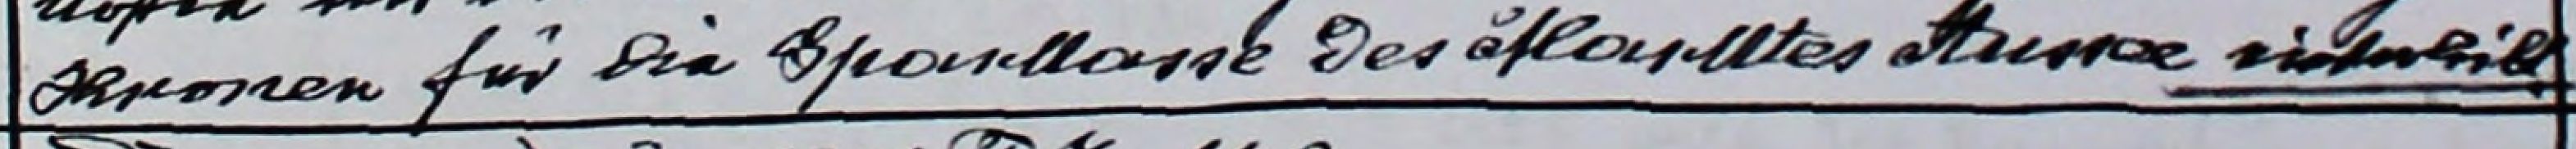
Kronen für die Sparkasse des Marktes Aussee einverleibt.
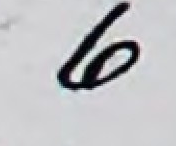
6
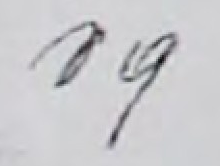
s 9
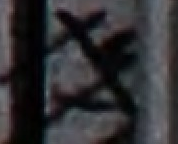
???
